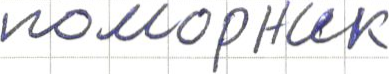поморник
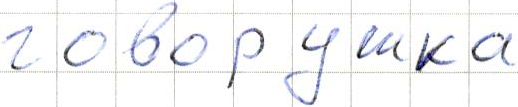говорушка
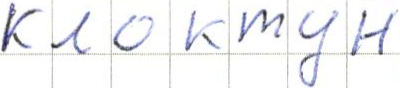клоктун
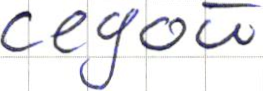седой
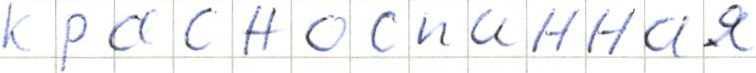красноспинная
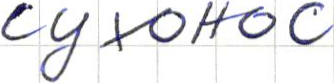сухонос
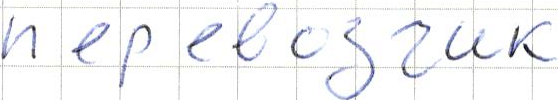перевозчик
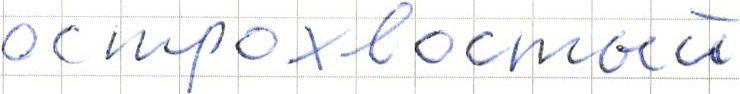острохвостый
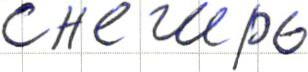снегирь
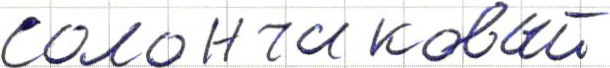солончаковый
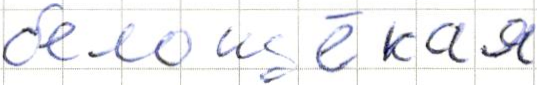белощёкая
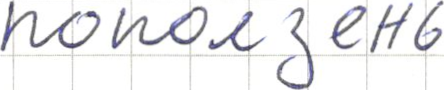поползень
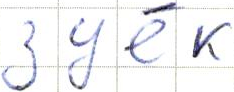зуёк
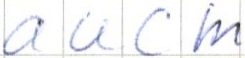аист
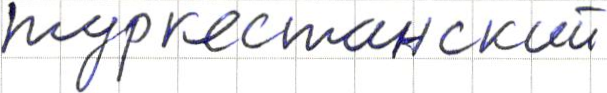туркестанский
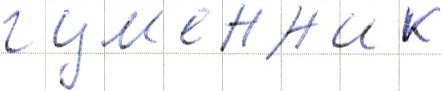гуменник
